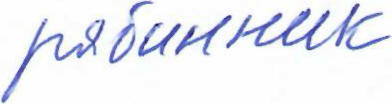рябинник
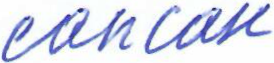сапсан
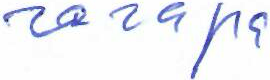гагара
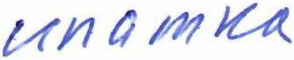ипатка
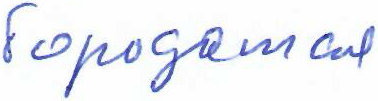бородатая
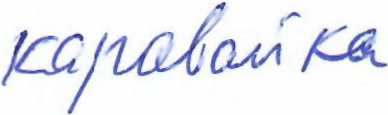каравайка
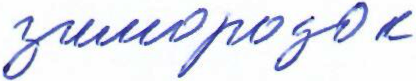зимородок
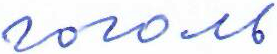гоголь
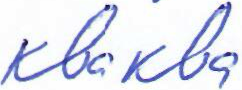кваква
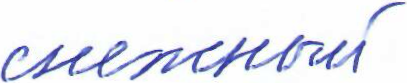снежный
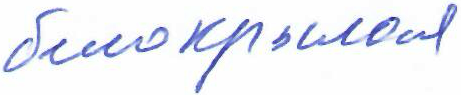белокрылая
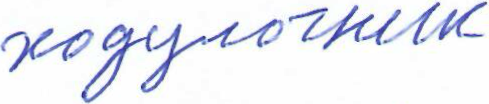ходулочник
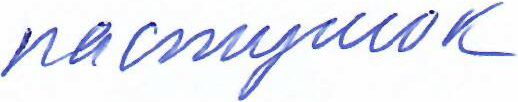пастушок
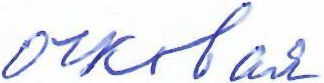очковая
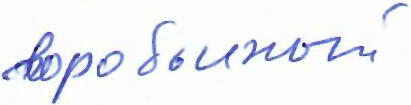воробьиный
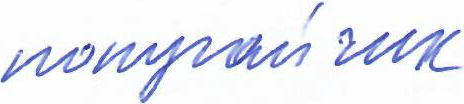попугайчик
